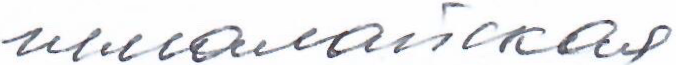гималайская
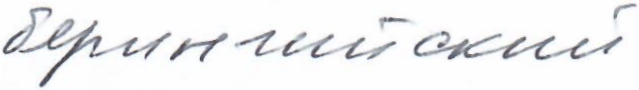берингийский
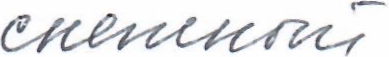снежный
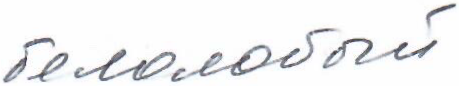белолобый
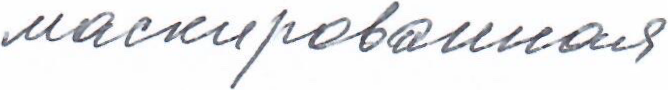маскированная
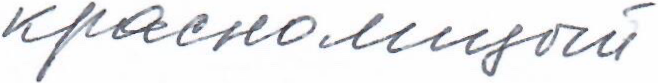краснолицый
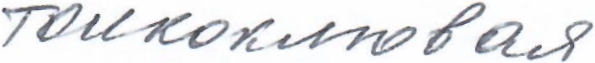тонкоклювая
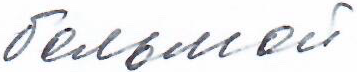большой
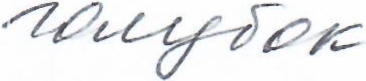голубок
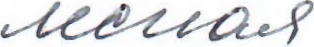лесная
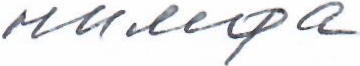нимфа
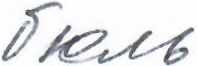бюль
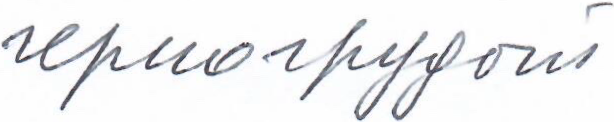черногрудый
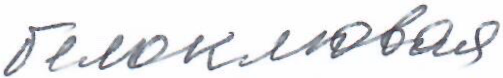белоклювая
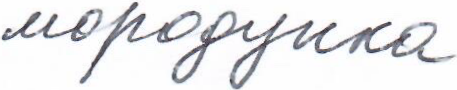мородунка
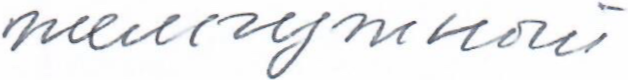жемчужный
